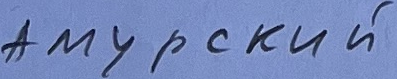амурский
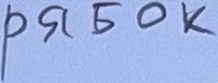рябок
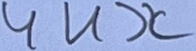чиж
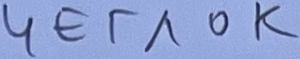чеглок
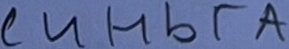синьга
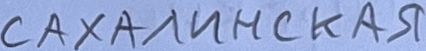сахалинская
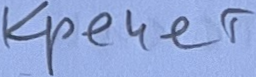кречет
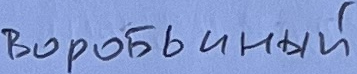воробьиный
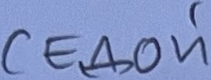седой
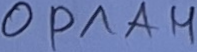орлан
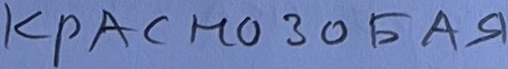краснозобая
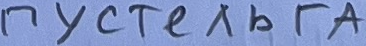пустельга
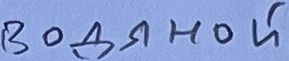водяной
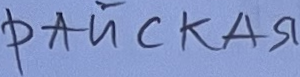райская
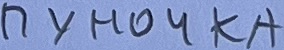пуночка
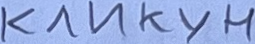кликун
